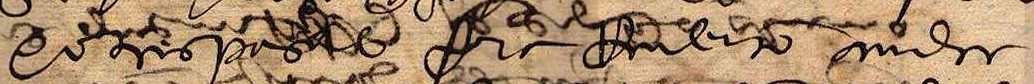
e o trespasado fora Rendeiro andre
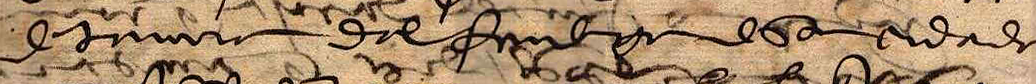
de tauora dalfandega desta cidade
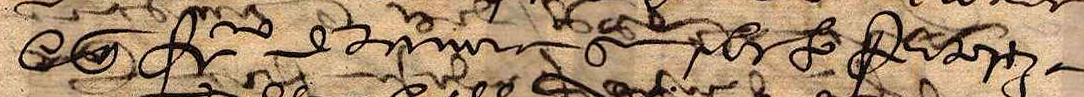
e q̄ frco de tauora seu sobrinho feitoriza
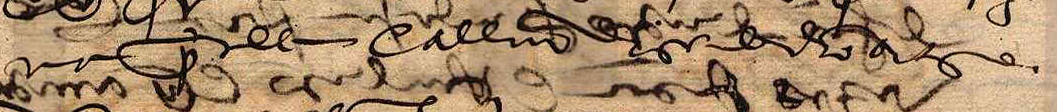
ua p̄o elle e all nō dise do dtō arto
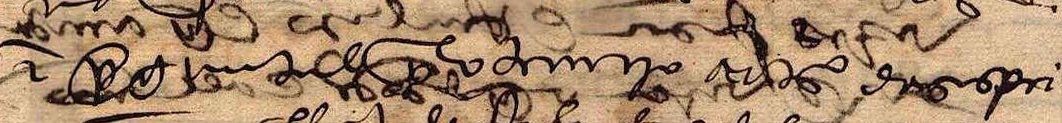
item ꝑguntada p̄lo terceiro arto da sospei
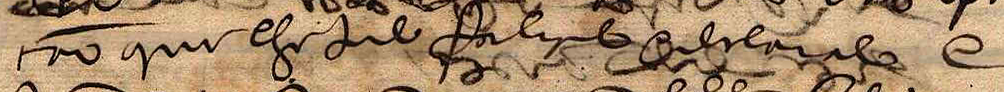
ção que lhe todo foi lydo e declarado e
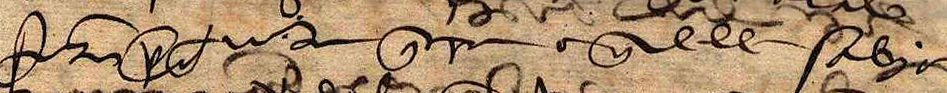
feita p̄gūta q̄ era o q̄ delle sabya
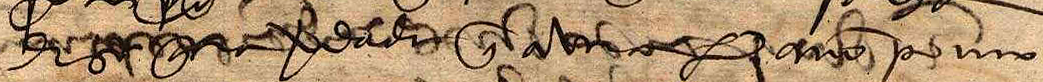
dise q̄ era ꝟdade q̄ avera hū anō pouco
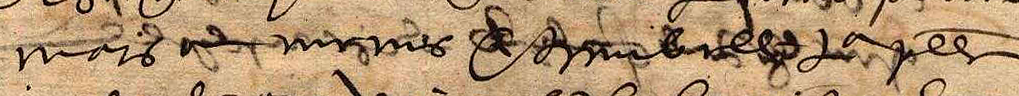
mais ou menos ētrando elle ta p̄lla
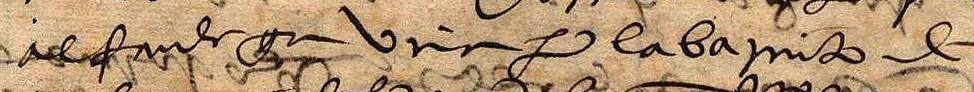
alfandega vira hū labarinto de
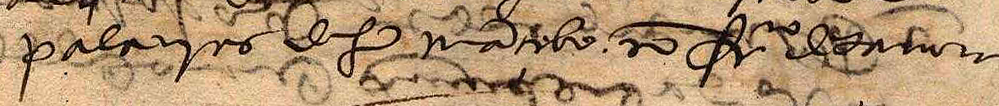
palauras de hū mācebo c̄o frco de tauora
